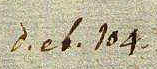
d.eb. 104
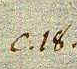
c.18.
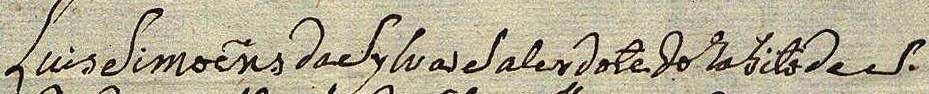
Luis Simoēns da Sylva Sacerdote do habito de S.
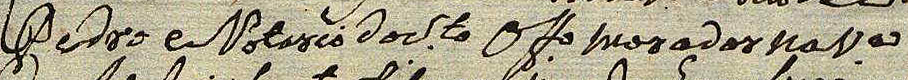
Pedro e Notario do S.to Off.o morador na V.a
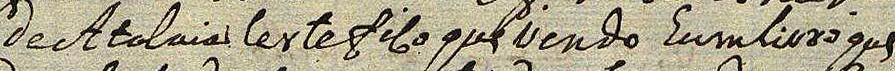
de Atalaia Certefico que vendo hum livro que
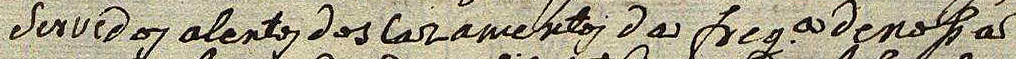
serve dos acentos dos cazamentos da freg.a de nossa
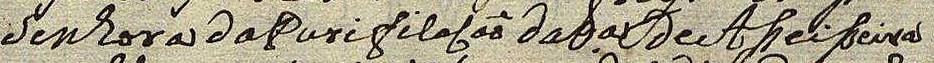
Senhora da PurificaÇaõ da V.a de Asseisseira
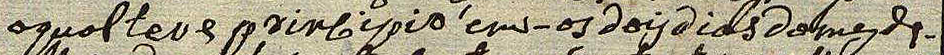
o qual teve principio em os dois dias do mes de
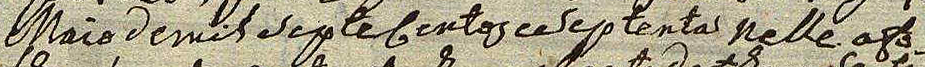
Maio de mil septeCentos e septenta nelle a fo
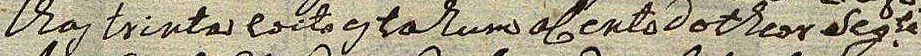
lhas trinta e oito esta hum asento do theor seg.te
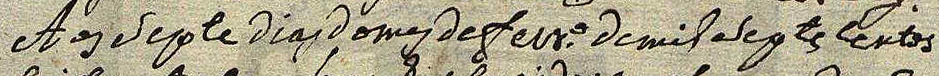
Aos septe dias do mes de fevr.o de mil septecentos
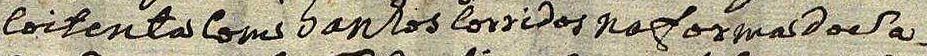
e oitenta com banhos corridos na forma do sa
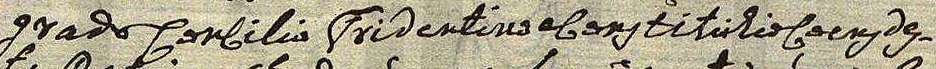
grado Concilio Tridentino e ConstiteihioÇoens des
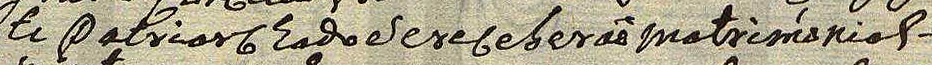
te Patriarchado se reCeberaõ matrimonial
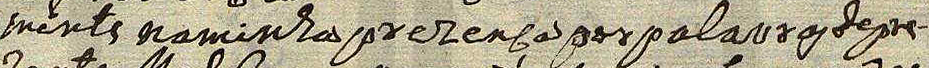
mente na minha prezenÇa por palavras de pre
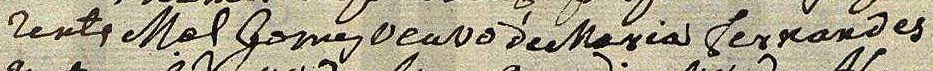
zente M.el Gomes veuvo de Maria Fernandes
